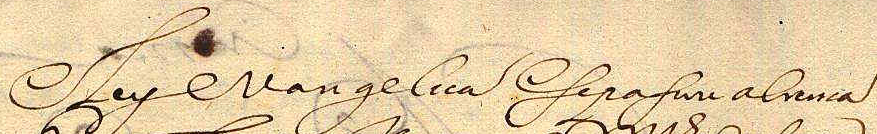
e Ley evangelica e se passou a Crença
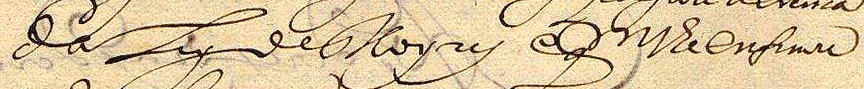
da Ley de Moyzés e qm lhe ensinou
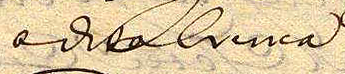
a dita Crença
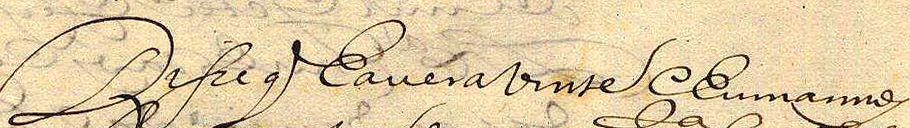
Disse q̄ hauera vinte e hum annos
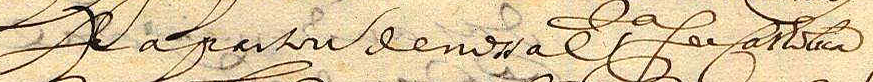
se apartou de nossa Sta fee Catholica
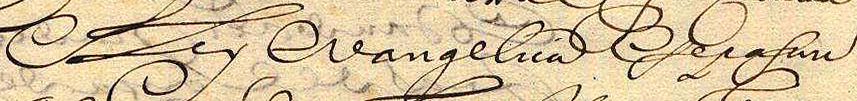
E Ley evangelica e se passou
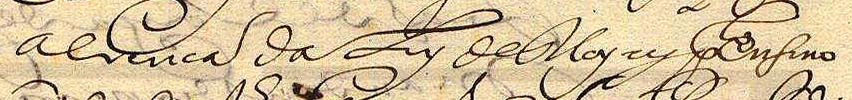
a crença da Ley de Moyzes plo ensino
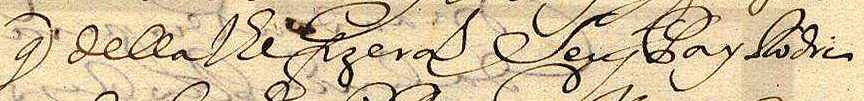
q̄ della lhe fizeraõ Seus Pay Rodri
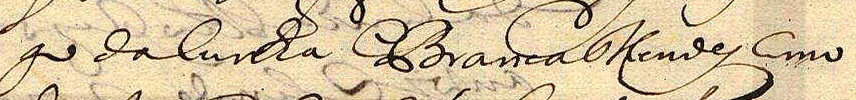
go da Cunha e Branca Mendes como
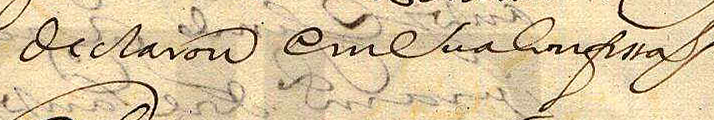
declarou em Sua Confissaõ
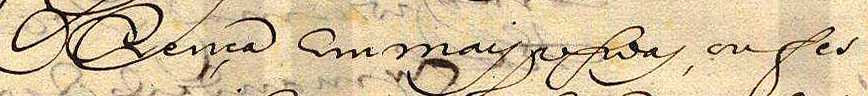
Crença com mais pessoas, ou fes
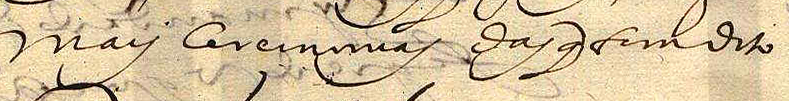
mais ceremonias das q̄ tem dito
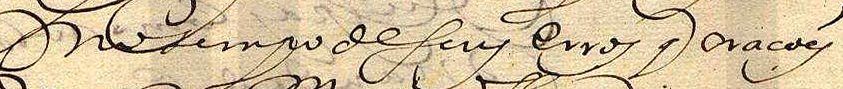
no tempo de seus erros q̄ oraçoẽs
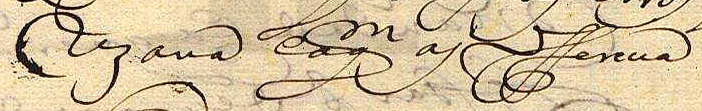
Vzava e a qm as Offerecia
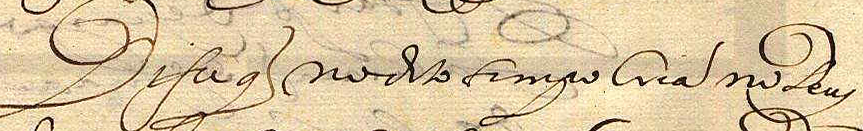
Disse q̄ no dito tempo Cria no Deus
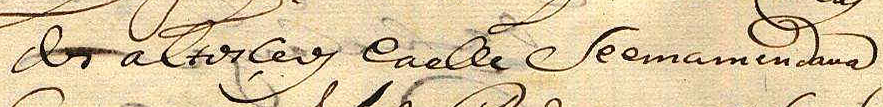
dos altos ceos e a elle Se encomendaua
